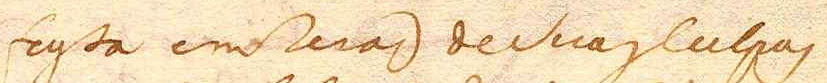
feyta em Rezaõ de Suas Culpas
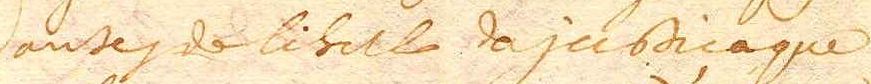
antes do libello da justiça que
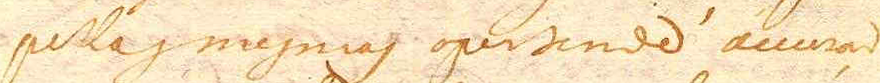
pellas mesmas o pertende accusar
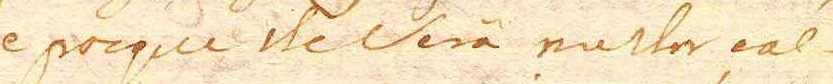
e porque lhe será melhor, e al
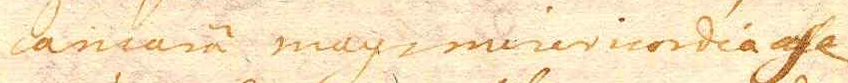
cançarâ mays misericordia ate
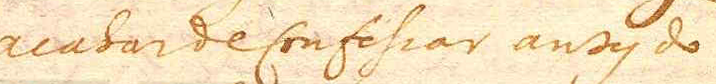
acabar de Confessar antes do
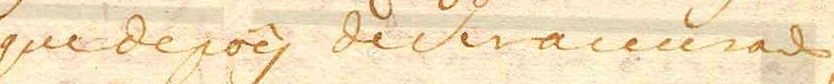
que depoês de ser accusado,
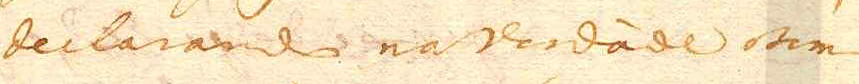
declarando na verdàde o tem
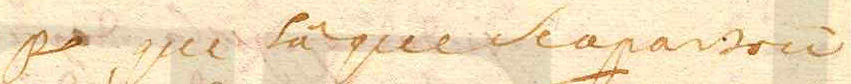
po, que hâ que se apartou
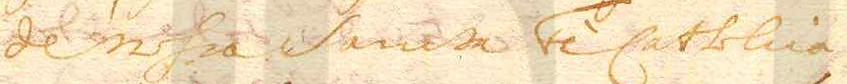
de nossa Sancta Fè Catholica,
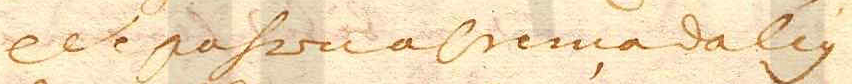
e se passou a Crença da ley
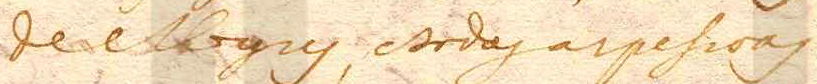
de Moyzes, e todas as pessoas
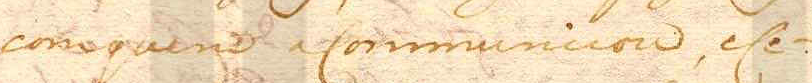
com quem a Communicou, e Ce
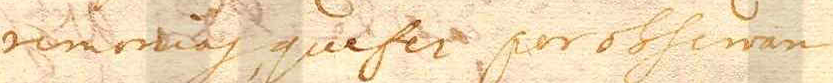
remonias, que fez por observan
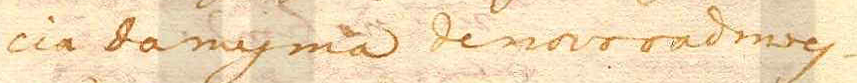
cia da mesma de novo o admoes
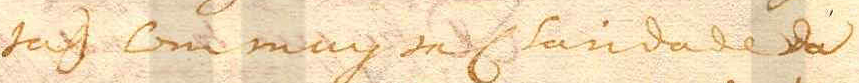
taõ com muyta Charidade da
